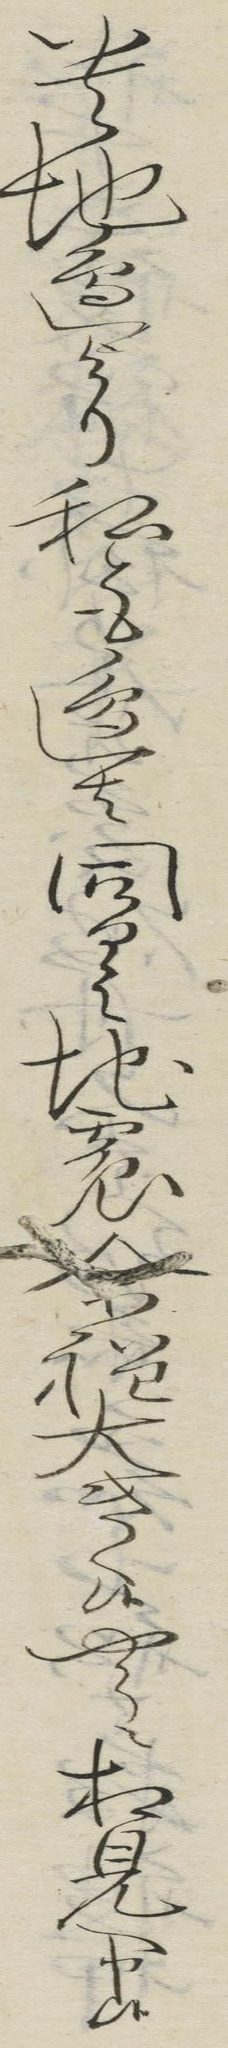貴地辺より私とも辺は同日之地震余程大きく候やうニ相見へ申候
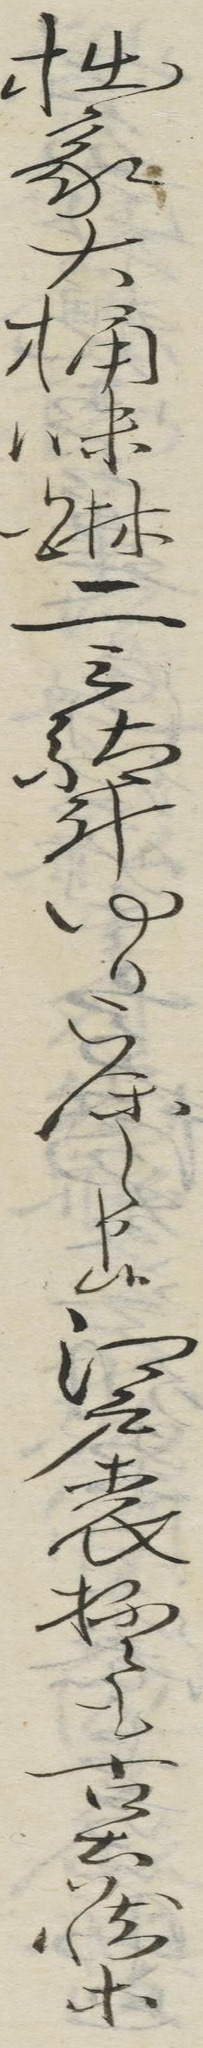拙家大桶味醂ニ三駄計ゆりこほし申候江戸表抔ニも古土蔵等
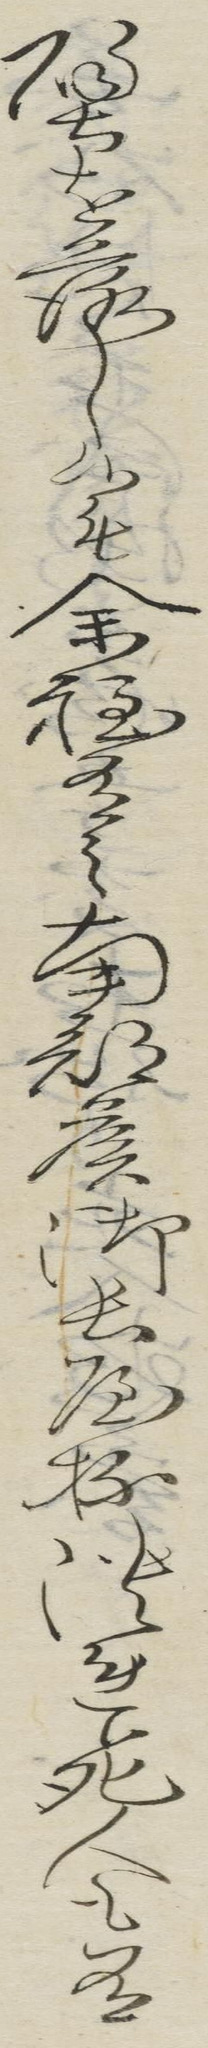壁を落し候も余程有之南部侯御長屋抔潰れ死人も有
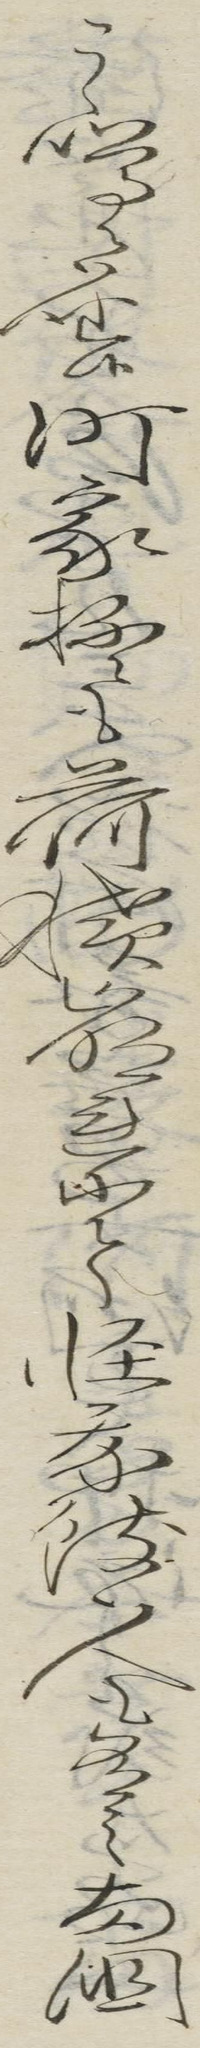之候噂ニ御座候町家抔ニも荷積崩にて怪我致候人も有之両国
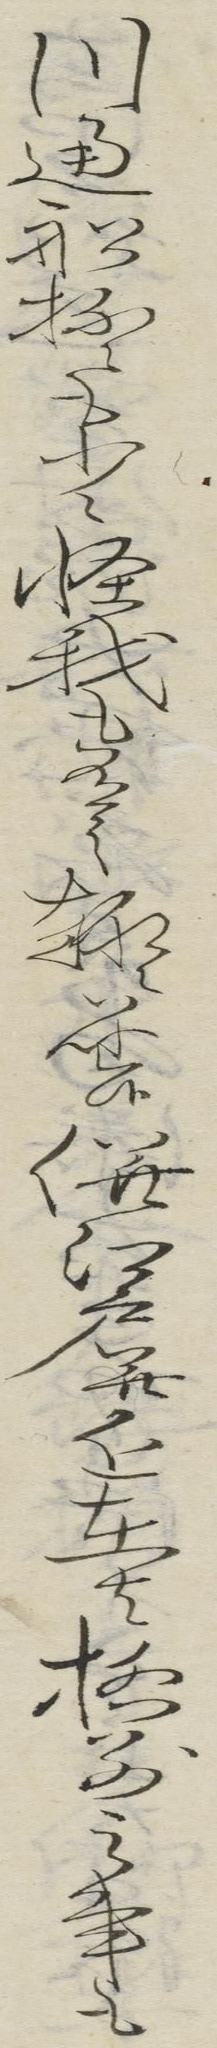川通船抔ニも少〻怪我も有之趣ニ御座候併江戸并近在は格別之事も
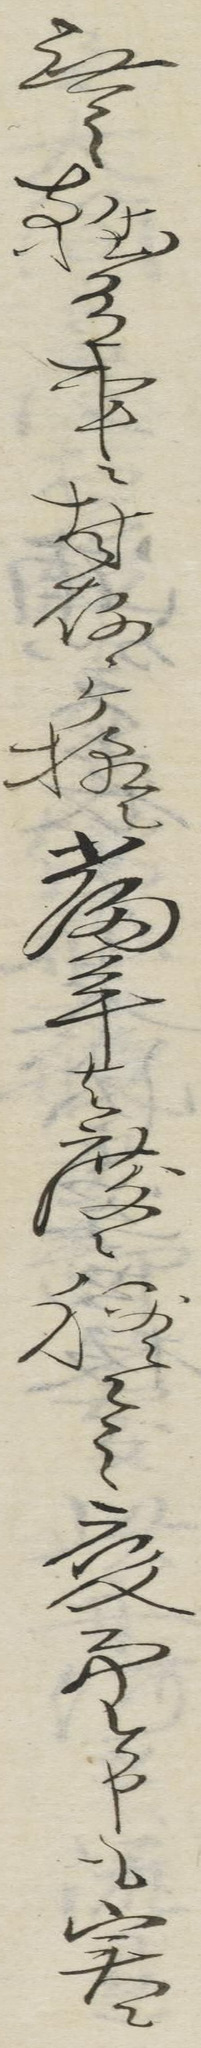無之難有事ニ奉存候ケ様ニ当年は度〻程〻之変事と申も実ニ
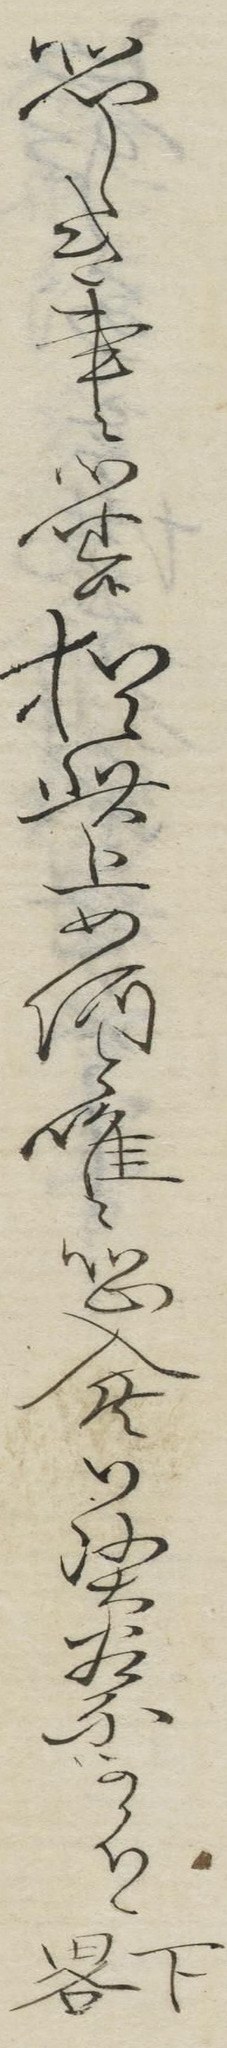恐しき事ニ御座候猶此上如何と唯〻恐入候御賢察可被下候下略
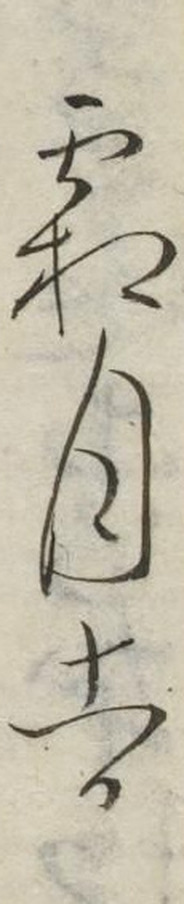霜月十一日
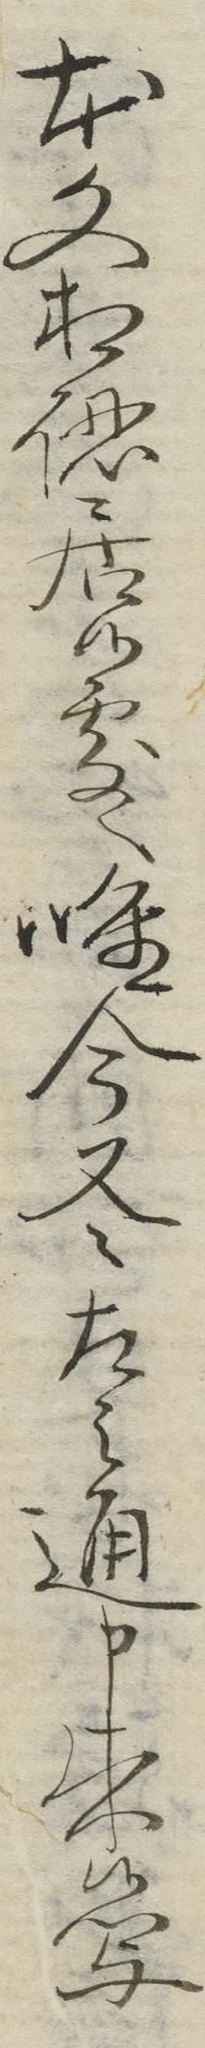本文相認居候処へ只今又〻左之通申来候写

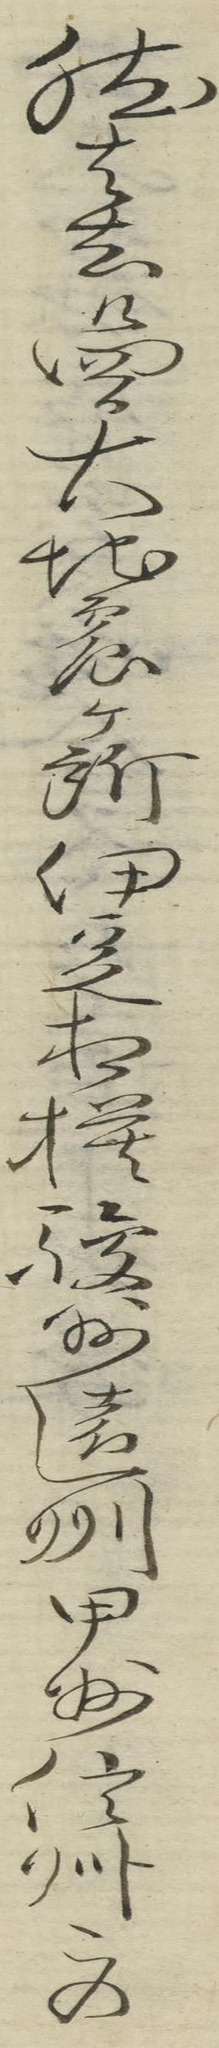然は去ル四日大地震ケ所伊豆相模駿州遠州甲州信州この
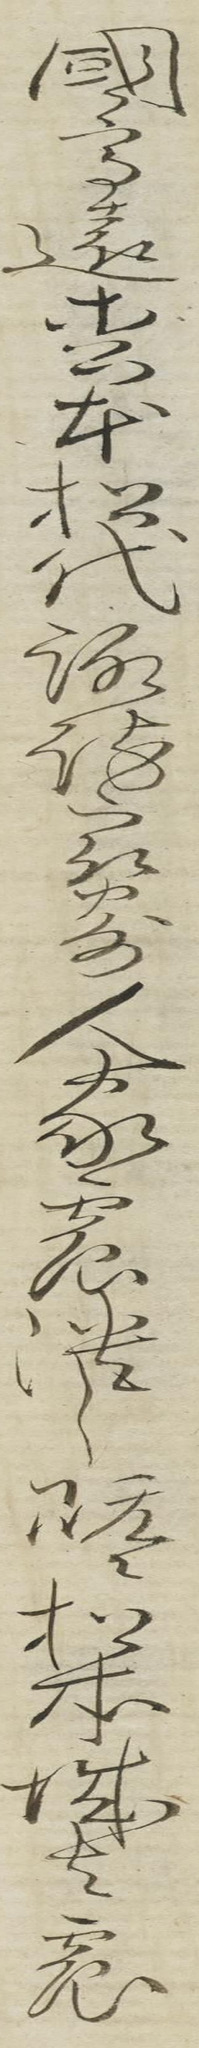国高遠松本松代諏訪最寄人家震潰し既ニ松本城は震
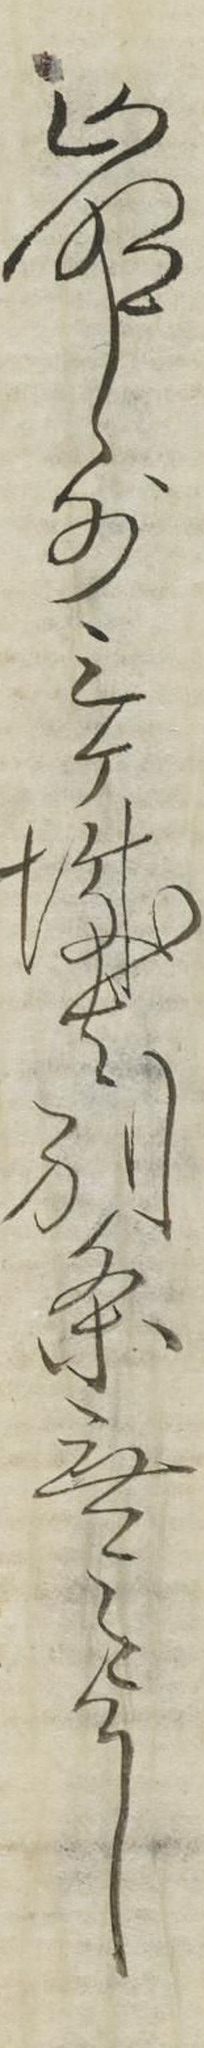崩し外三ケ城は別条無之よし
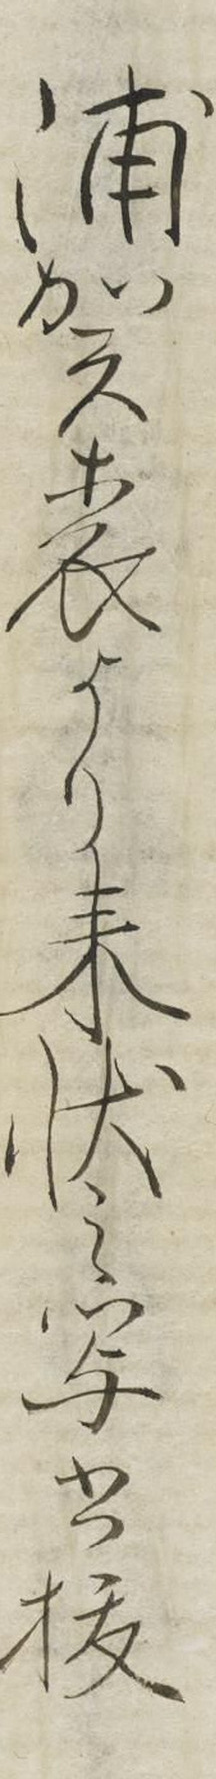浦賀表より来状之写書抜
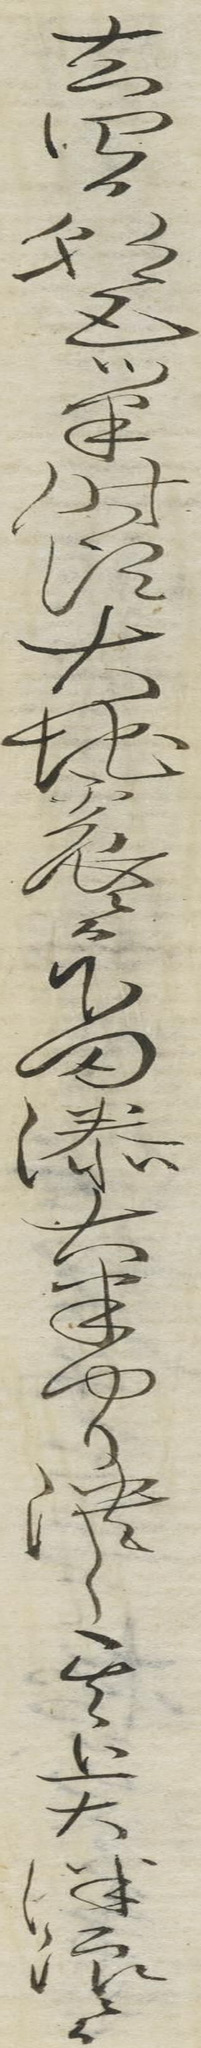去四日朝五ツ半時頃大地震にて下田湊大半ゆり潰し其上大津浪ニ而
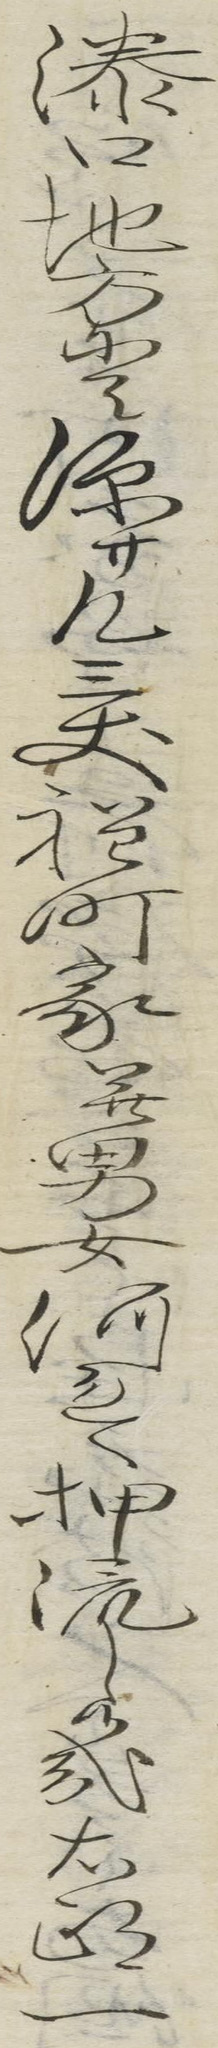湊口地方にて深サ凡三丈程町家并男女何れへ押流し候哉右跡一
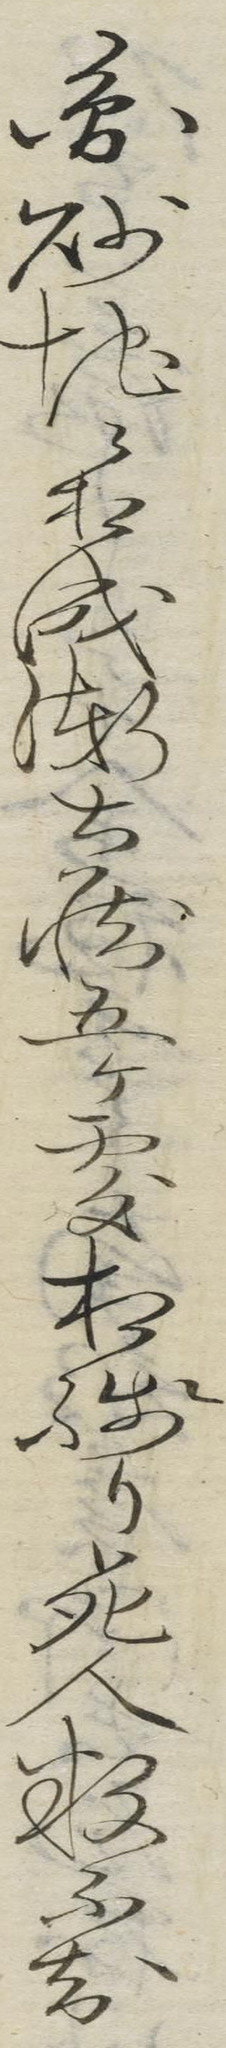円砂地ニ相成漸土蔵五ケ処相残り死人数不知
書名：大地震實録
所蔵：東京大学地震研究所図書室 Earthquake Research Institute Library, The University of Tokyo, JAPAN
